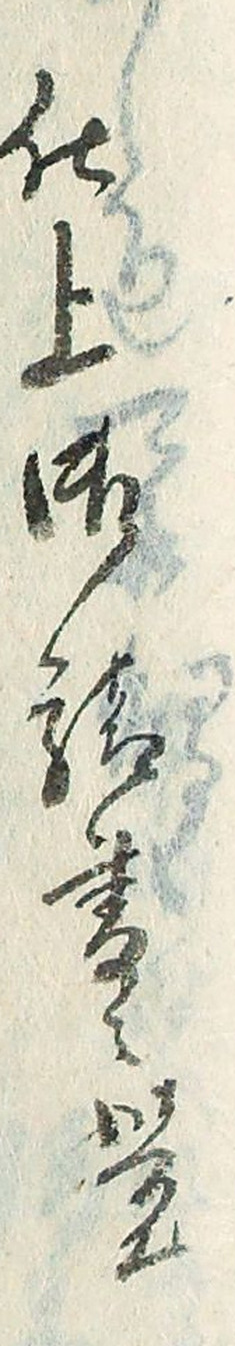仕上御請書之覚
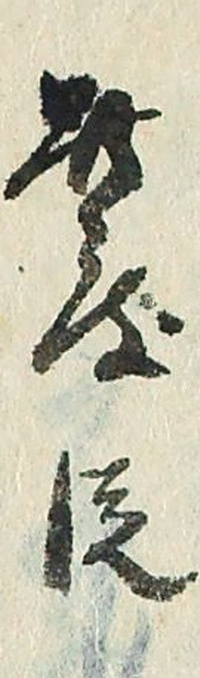此度従
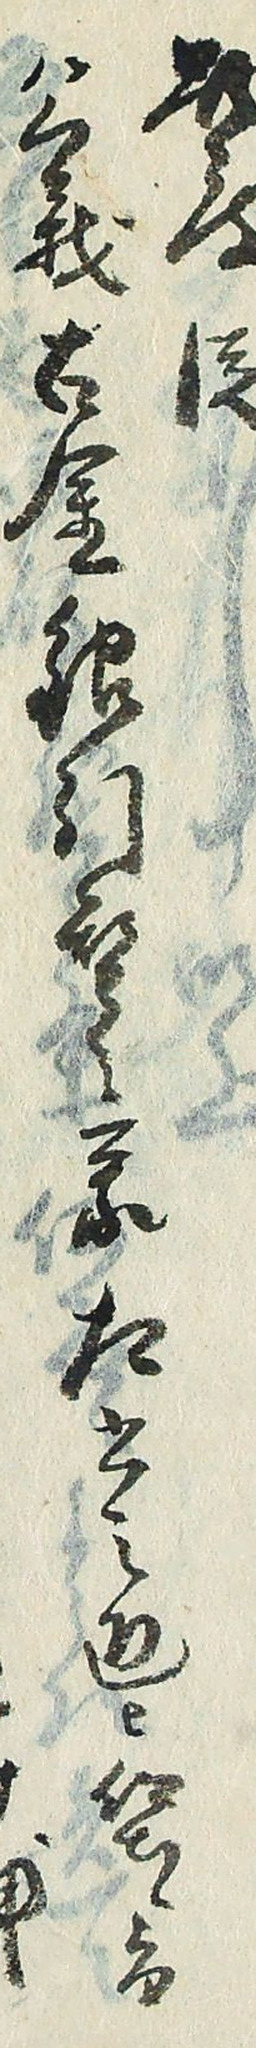公義古金銀引替之義左書之通被仰出候旨
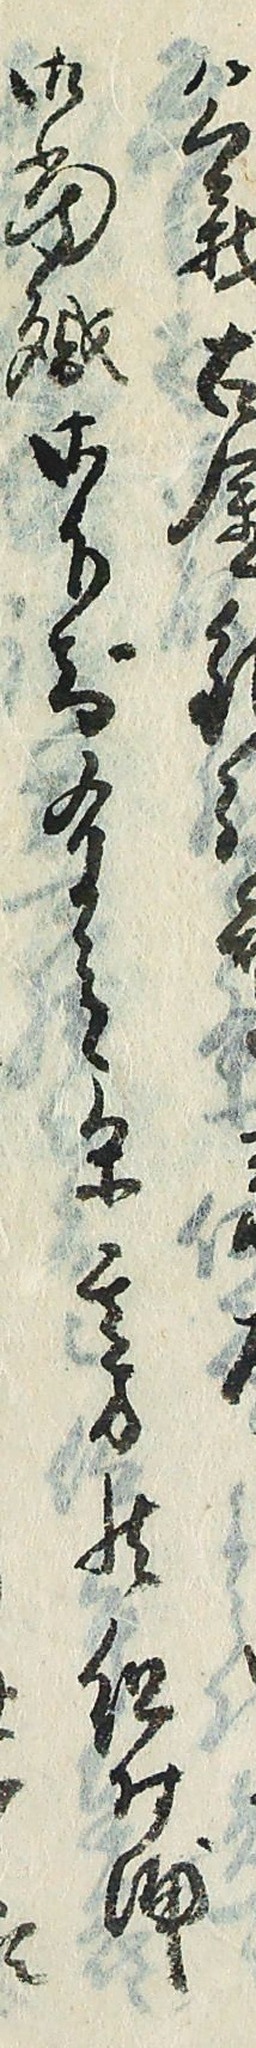御当職御下知有之候条其方共組村浦
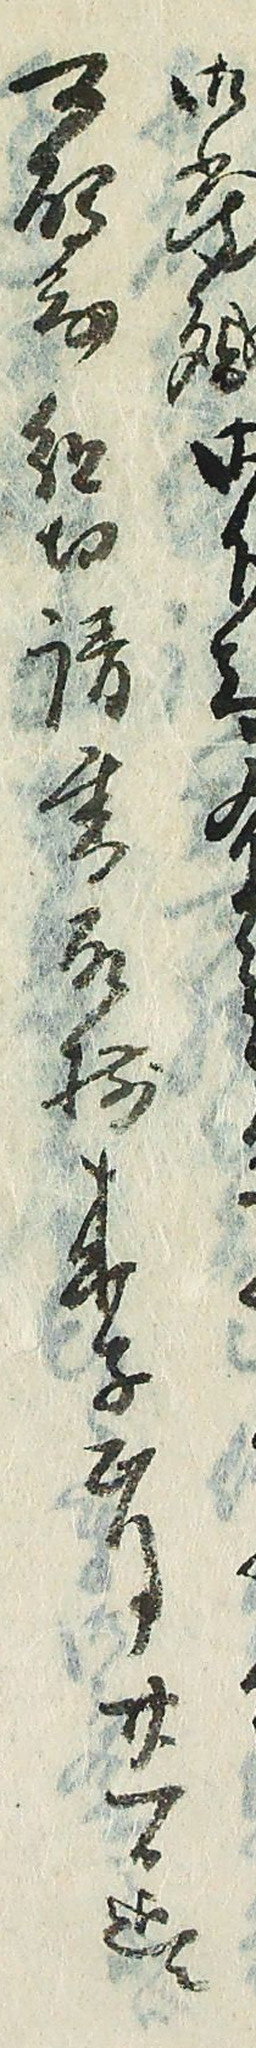可触知組切請書取揃来子正月廿一日迄に
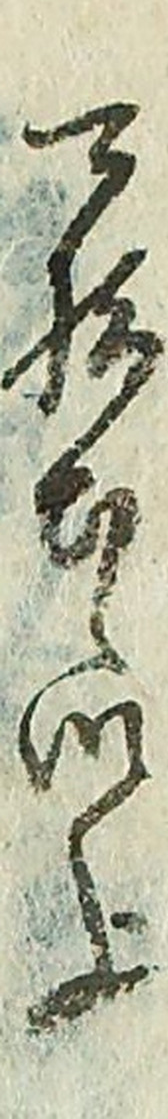可指出候以上
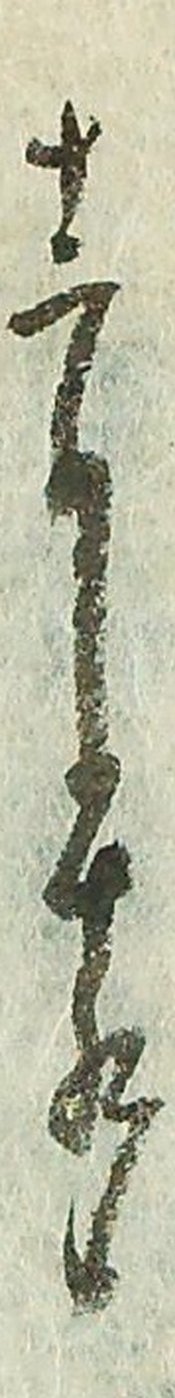十二月十九日
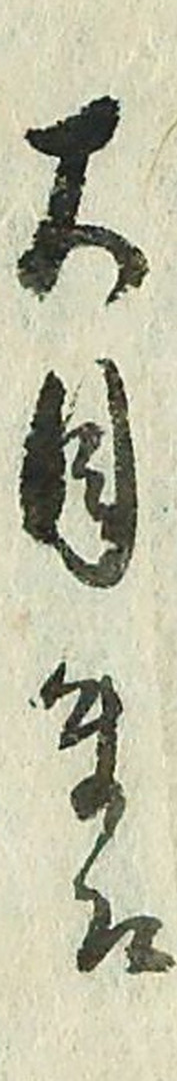大目付江
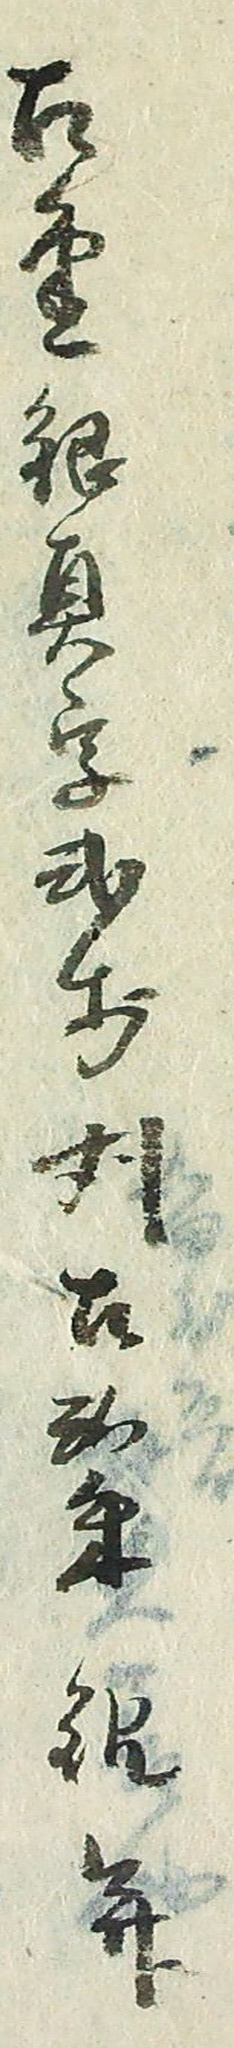古金銀真字弐歩判古弐朱銀幷
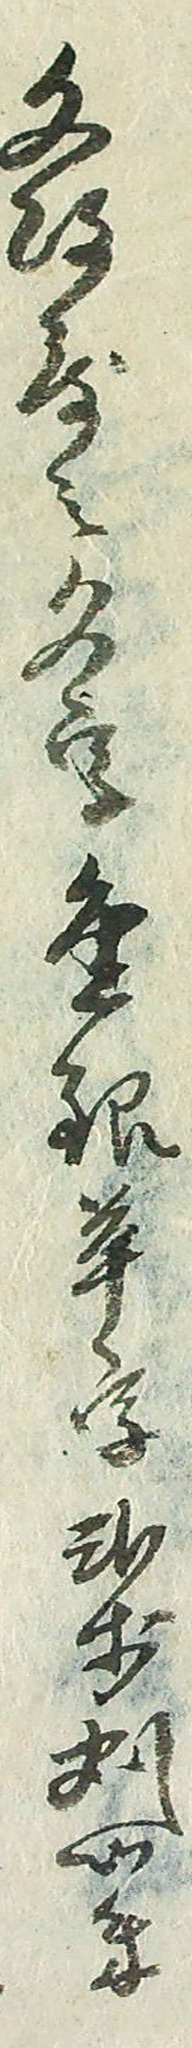文政度之文字金銀草字弐歩判弐朱
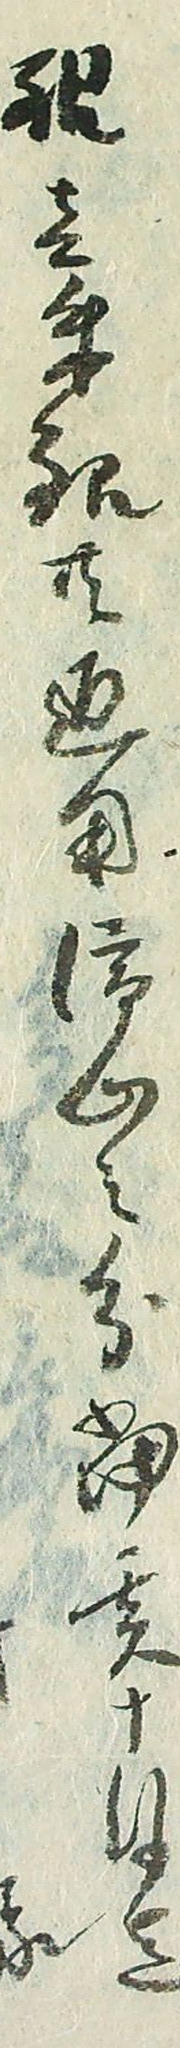銀壱朱銀共通用停止之分当亥十月迄
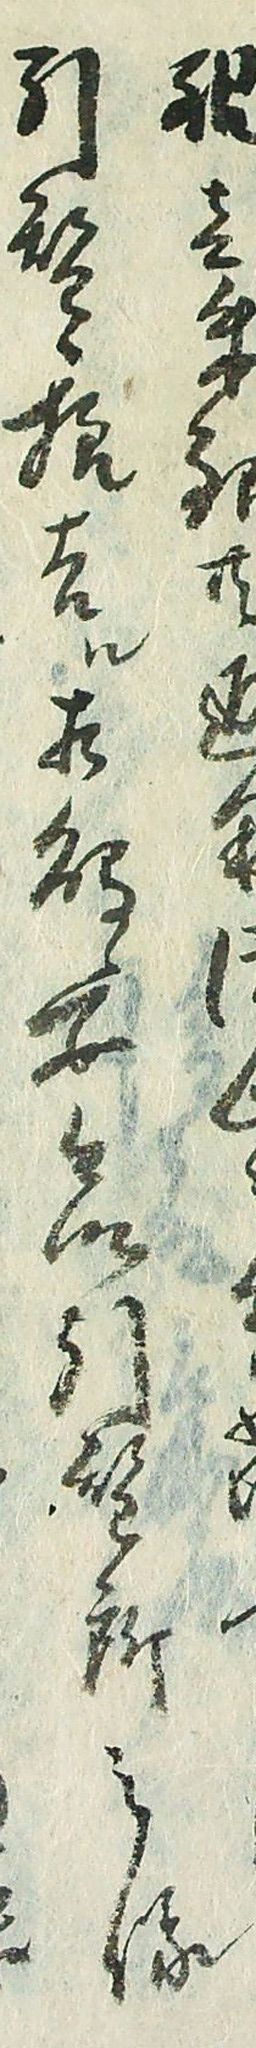引替候様去る相触候所今以引替所之儀
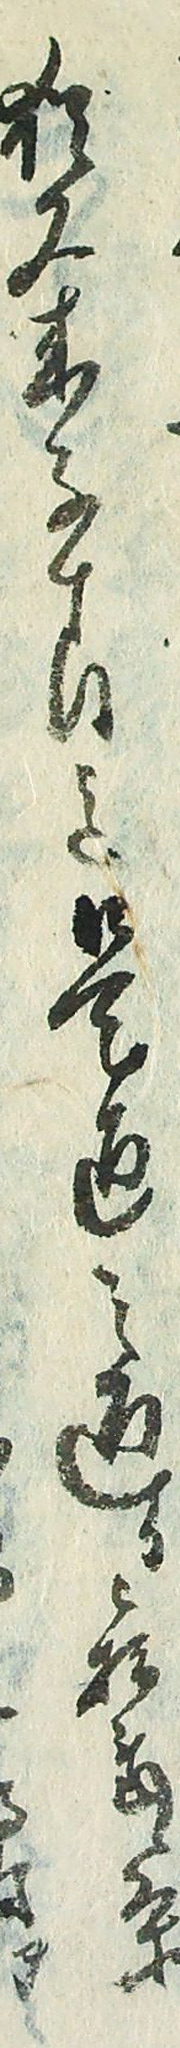猶又来子十月迄是迄之通り被指置候条
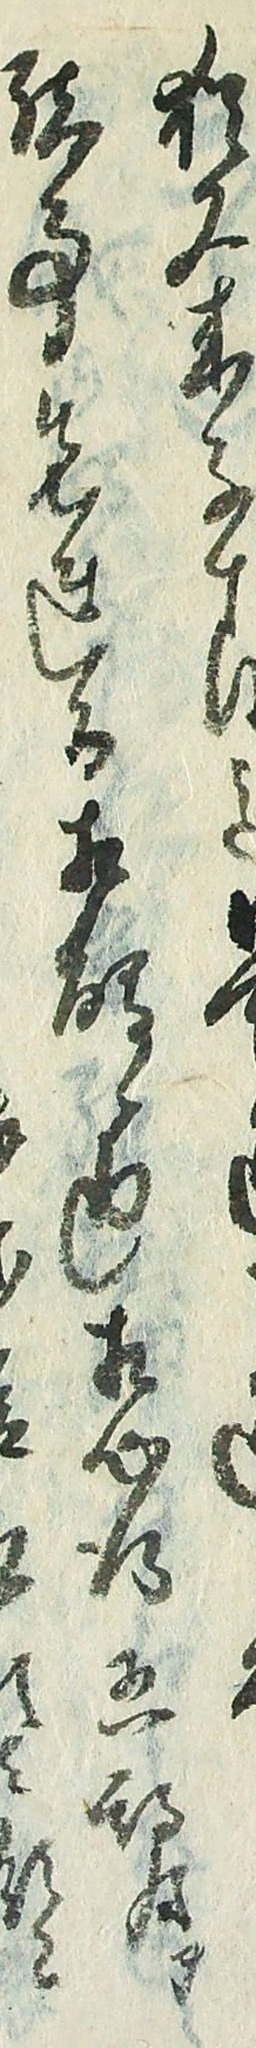諸事先達而相触候通相心得右期月を
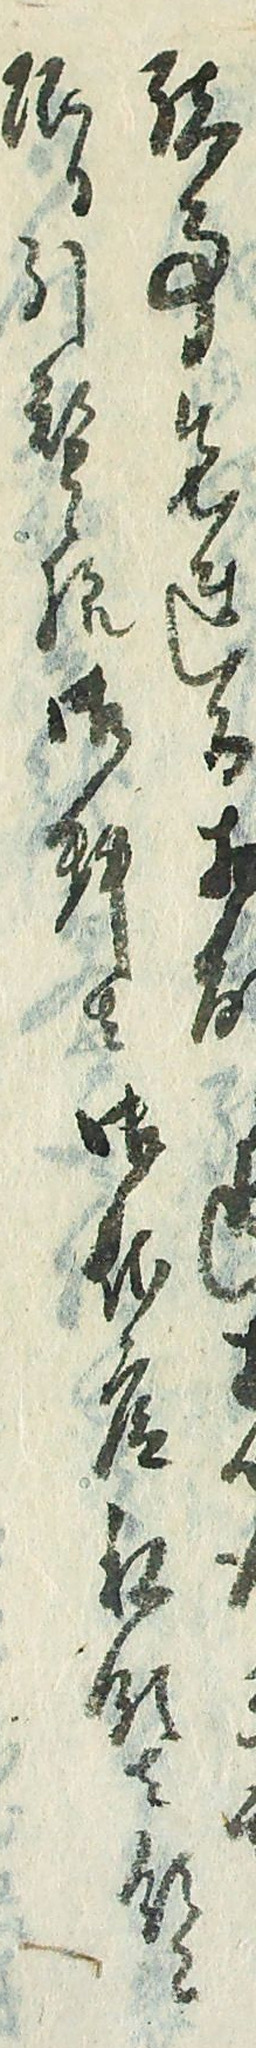限り引替候様御料は御代官私領は領主
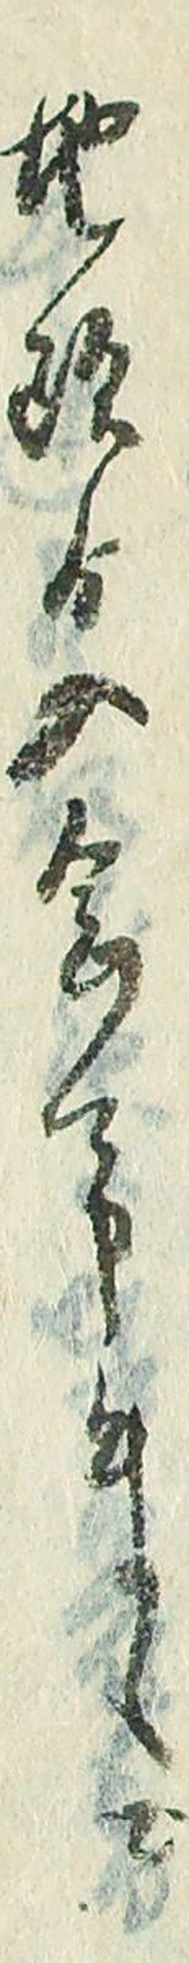地頭ゟ入念可申付候以上
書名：諸御用御□受書控
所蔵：鳴門教育大学 Naruto University of Education
